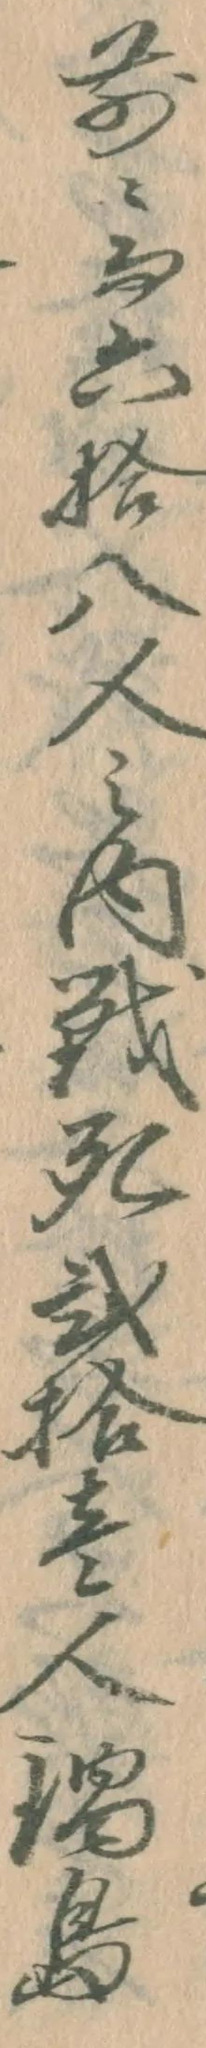前に而六拾八人之内戦死弐拾壱人鍋島
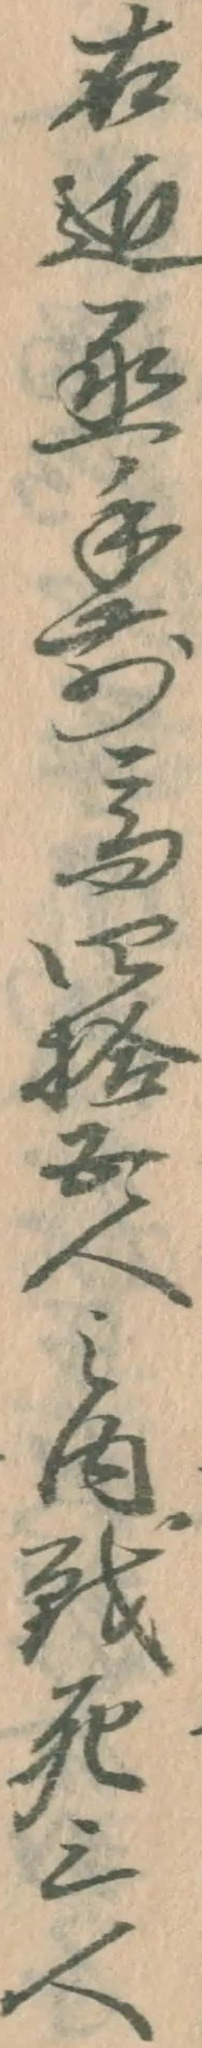右近丞手前に而四拾五人之内戦死三人
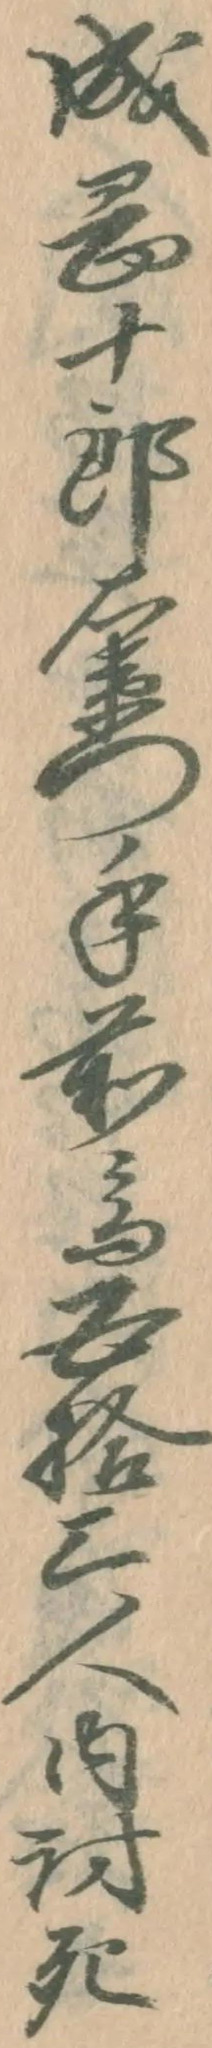成岡十郎右衛門手前に而五拾参人内討死

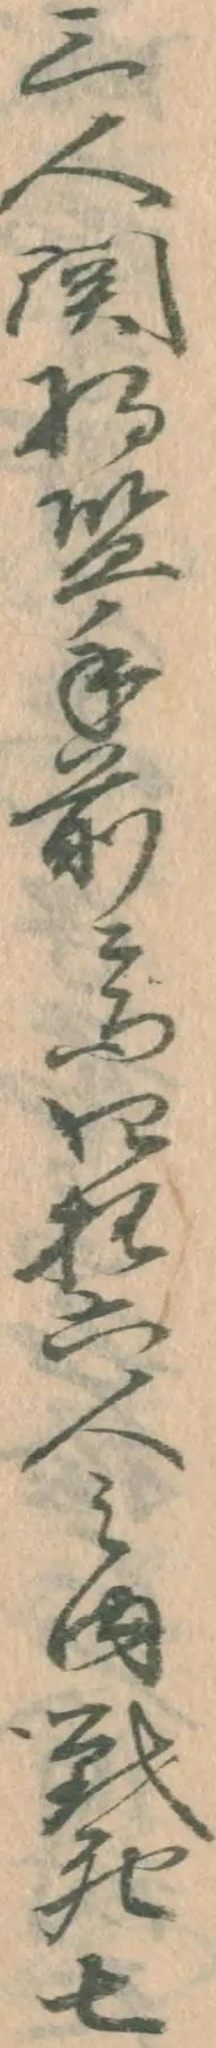三人関将監手前に而四拾六人之内戦死七
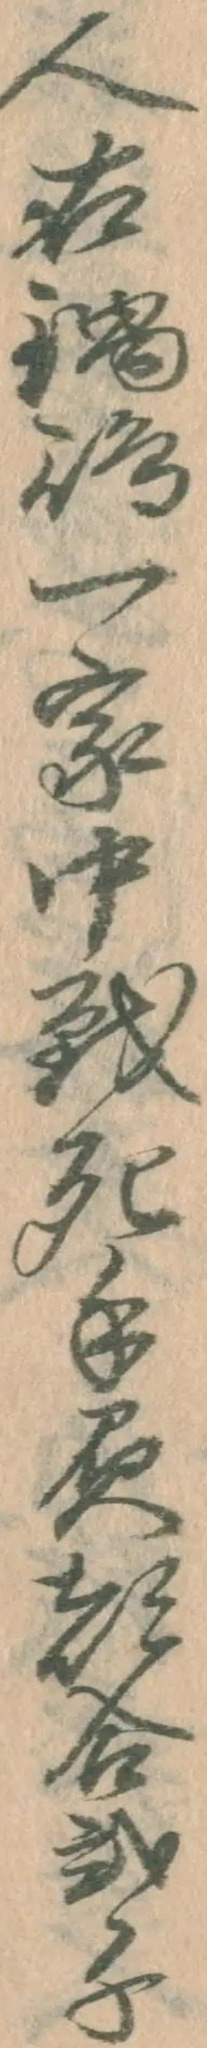人右鍋島一家中戦死手負都合弐千
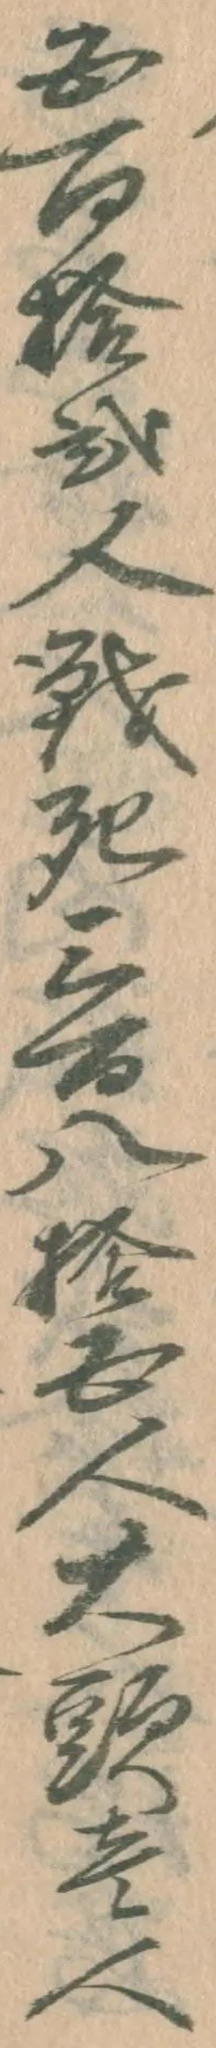五百拾弐人戦死三百八拾五人大頭壱人
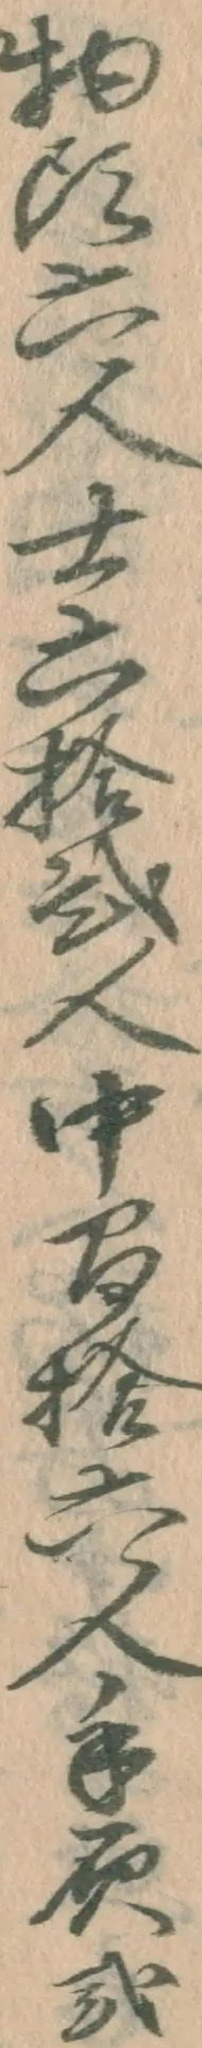物頭六人士六拾弐人中間拾六人手負弐
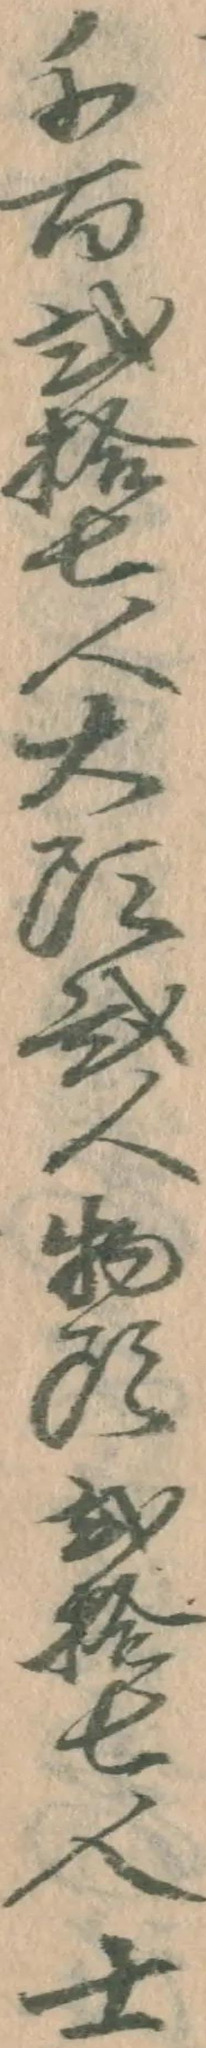千百弐拾七人大頭弐人物頭弐拾七人士
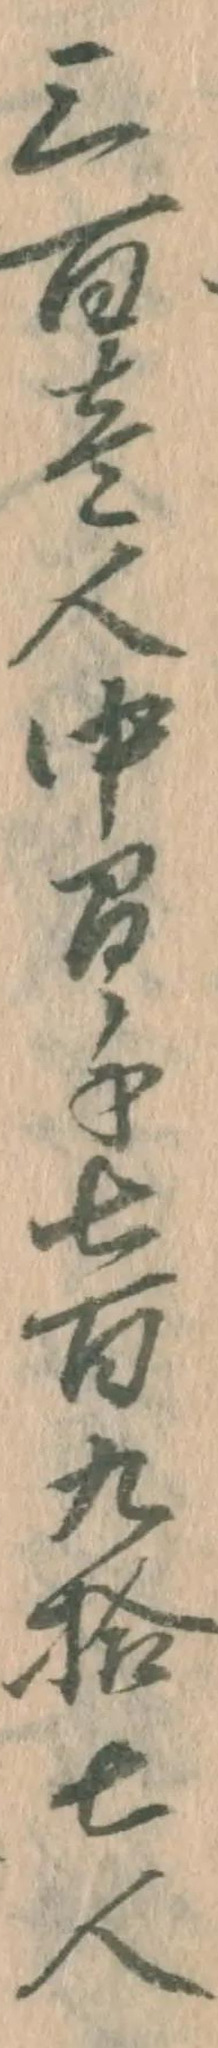三百壱人中間千七百九拾七人
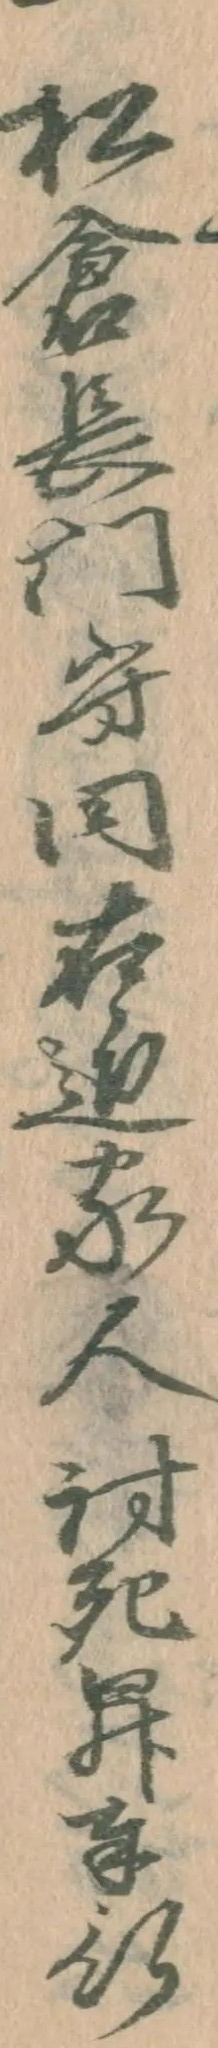一松倉長門守同右近家人討死昇奉行
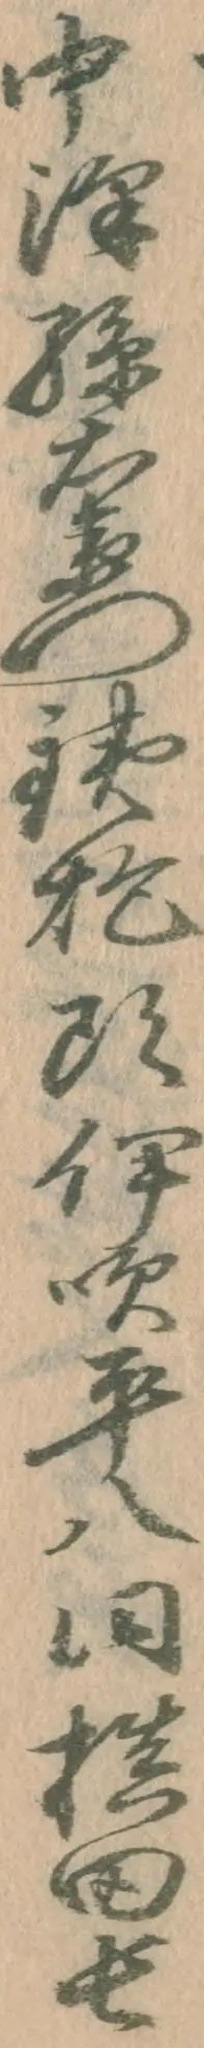中沢孫右衛門鉄炮頭伊吹平八同横田長
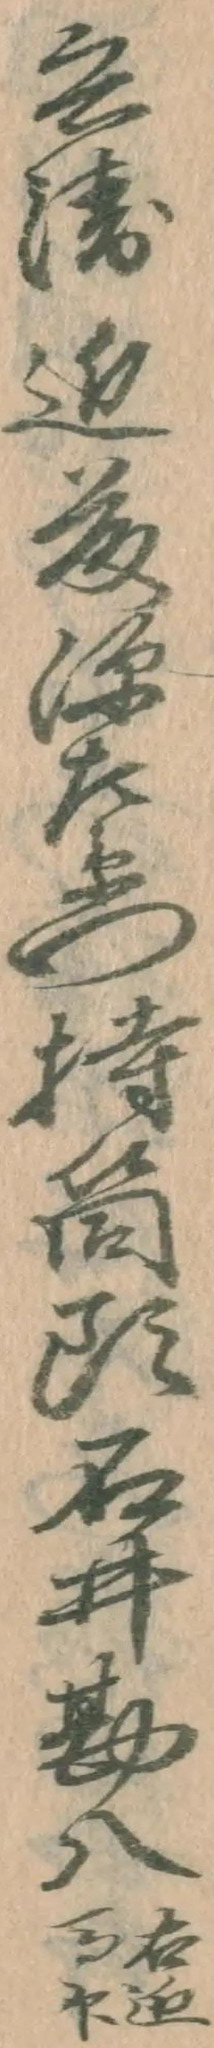兵衛近藤源左衛門持筒頭石井勘八右近馬印
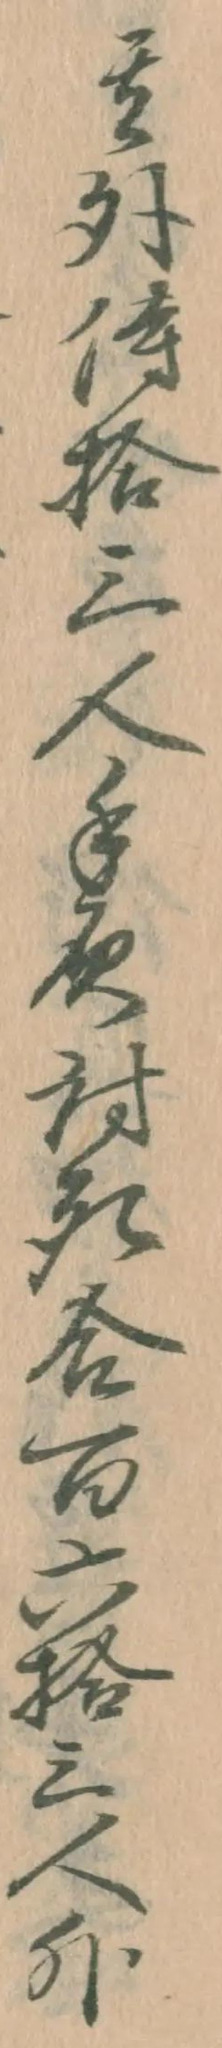其外侍拾三人手負討死合百六拾三人外
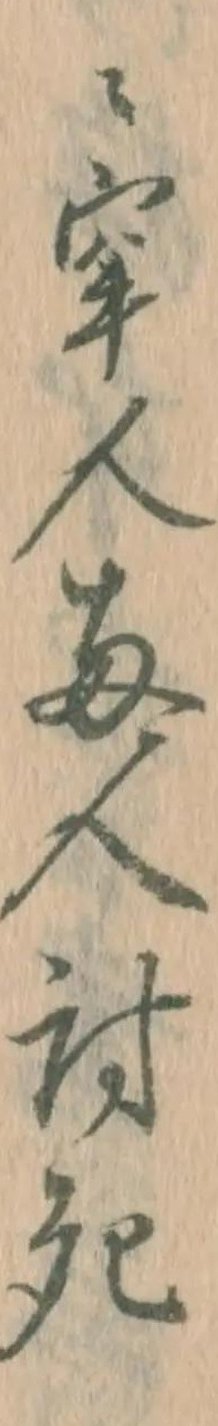に牢人両人討死
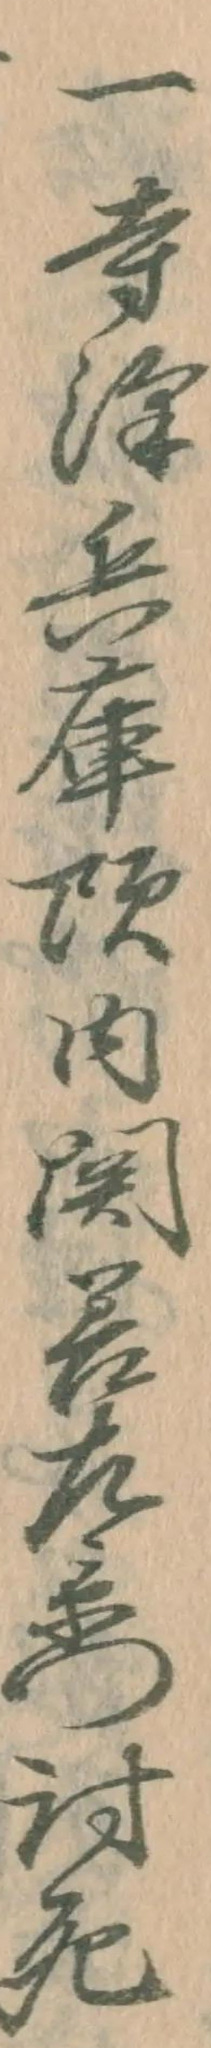一寺沢兵庫頭内関善左衛門討死
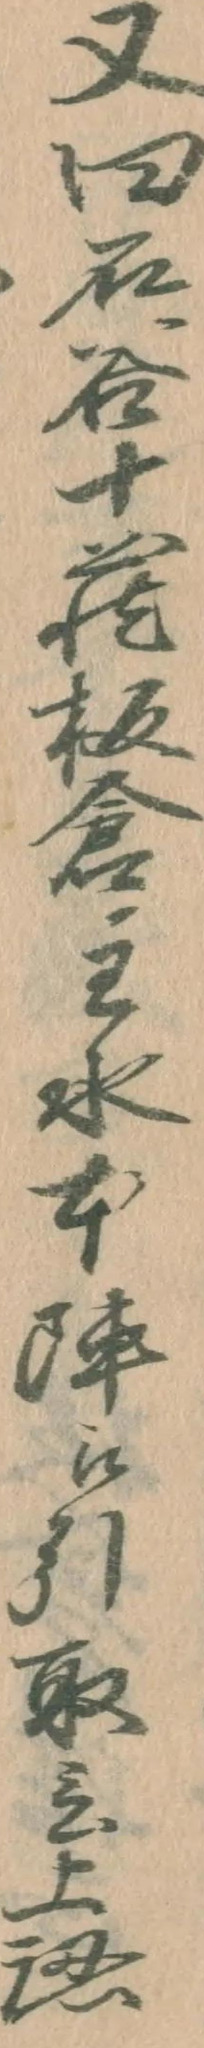又曰石谷十蔵板倉主水本陣江引取言上認
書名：切支丹御退治記 49巻. [5]
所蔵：国立国会図書館 National Diet Library, JAPAN
